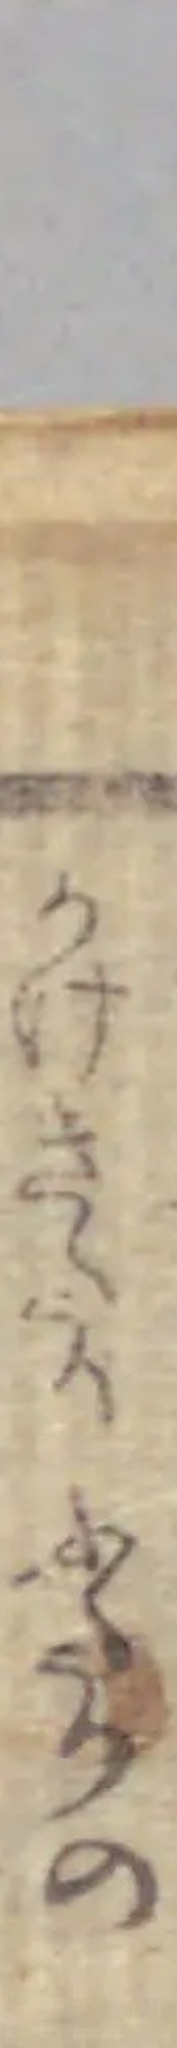かけきたりふたりの
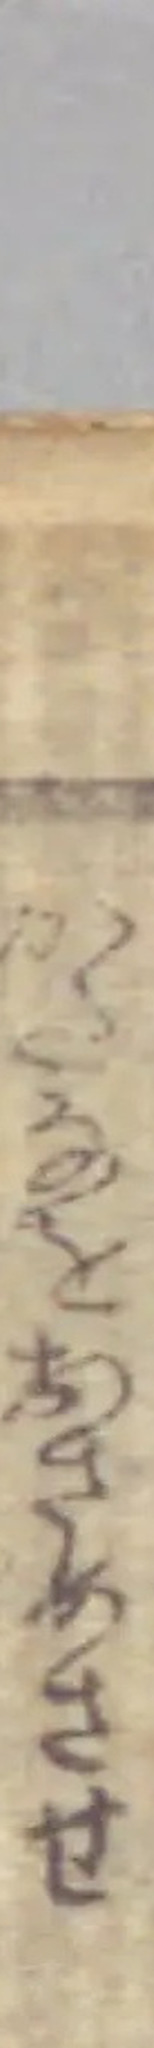かたなをおさめさせ
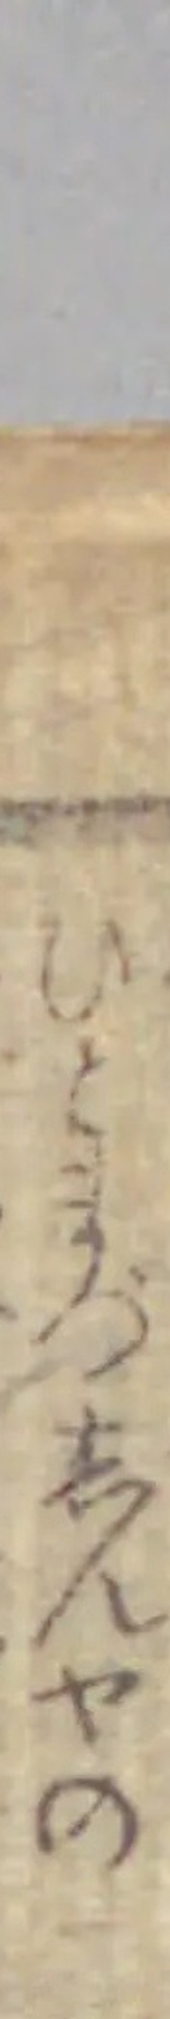ひとまづしんやの
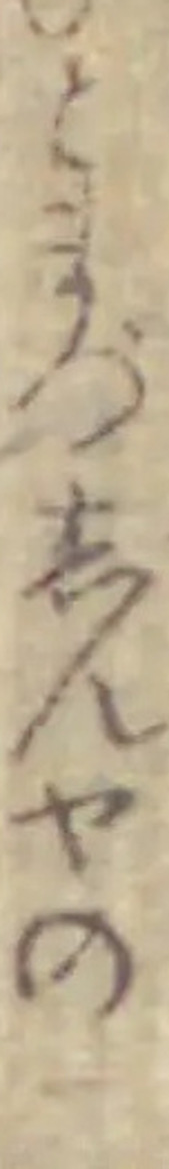ひとまづしんやの
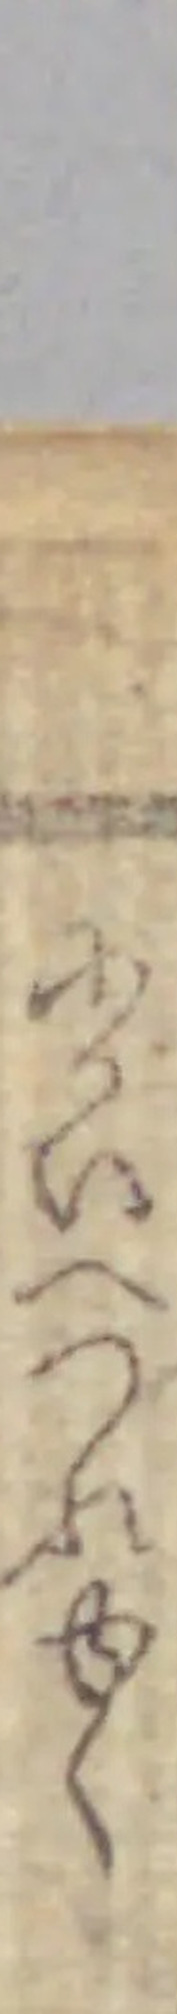にかいへつれゆく
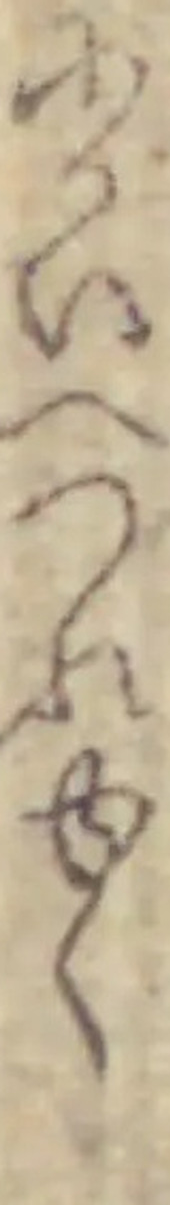にかいへつれゆく
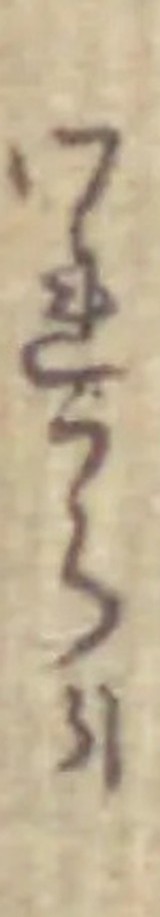われから
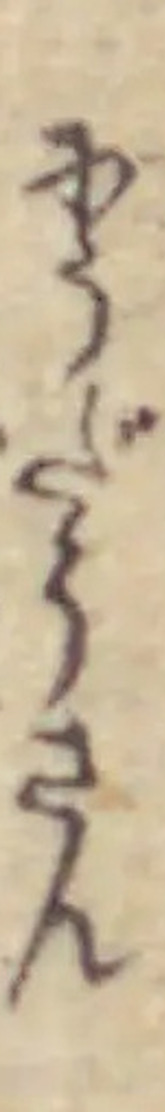にうだうさん
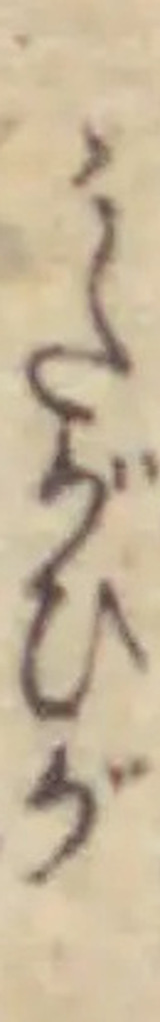うたがひが
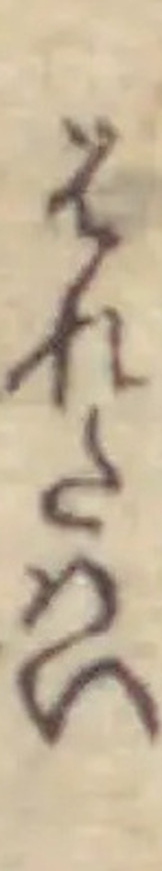それたはい
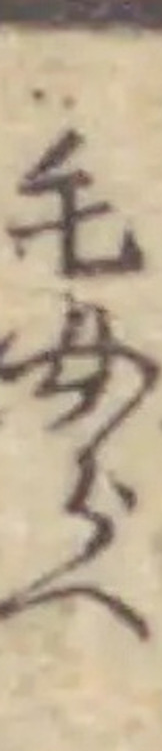毛女郎へ
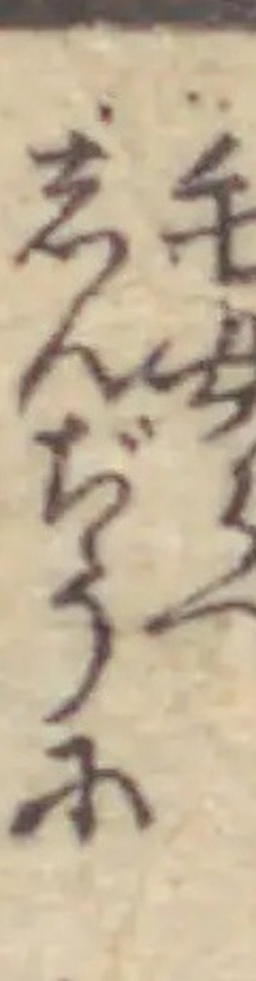しんぢうに
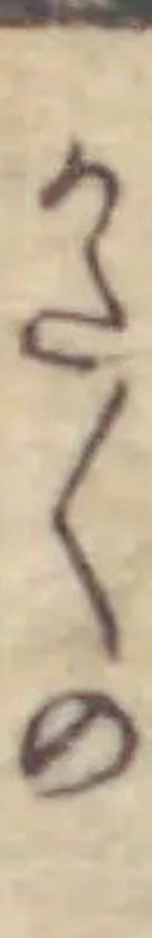かた〳〵の
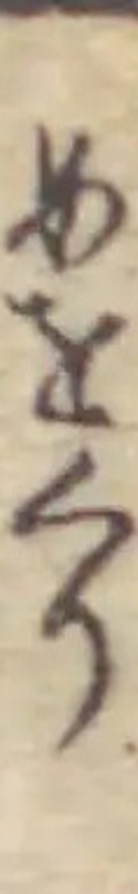めをくり
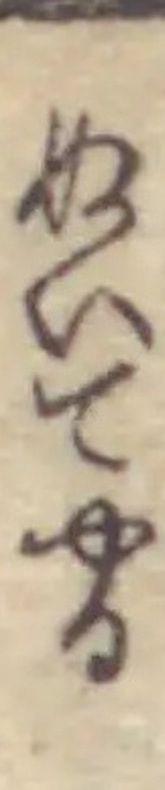ぬいてやる
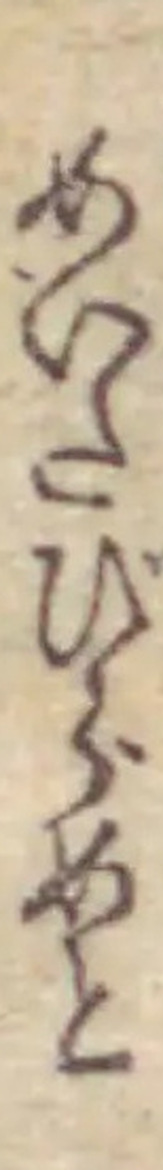めいたびらめと
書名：大昔化物双紙 2巻
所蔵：国立国会図書館 National Diet Library, JAPAN
